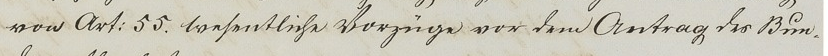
von Art: 55. wesentliche Vorzüge vor dem Antrag des Bun-
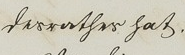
desrathes hat.
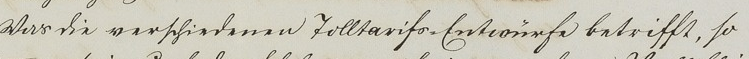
Was die verschiedenen Tolltarifs-Entwürfe betrifft, so
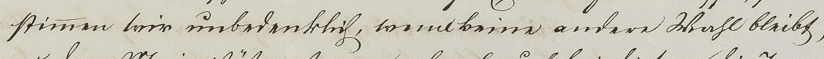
stimmen wir unbedenklich, wenn keine andere Wahl bleibt,
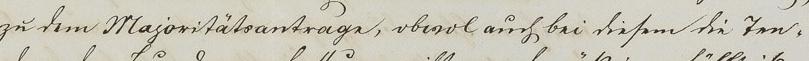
zu dem Majoritätsantrage, obwol auch bei diesem die Ten-
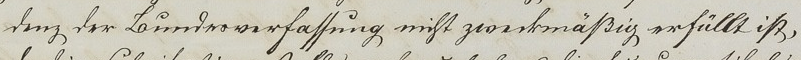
denz der Bundesverfassung nicht zweckmäßig erfüllt ist,
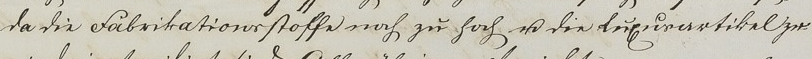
da die Fabrikationsstoffe noch zu hoch & die Luxusartikel zu
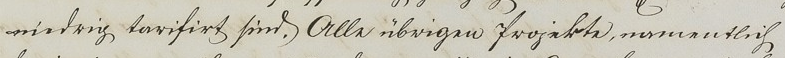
niedrig tarifirt sind. Alle übrigen Projekte, namentlich
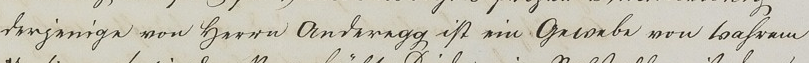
derjenige von Herrn Anderegg ist ein Gewebe von wahrem
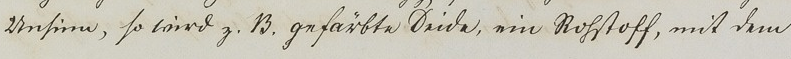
Unsinn, so wird z. B. gefärbte Seide, ein Rohstoff, mit dem
